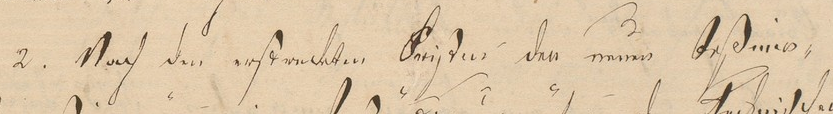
2. Nach den erstreckten Fristen der neuen Teßiner -
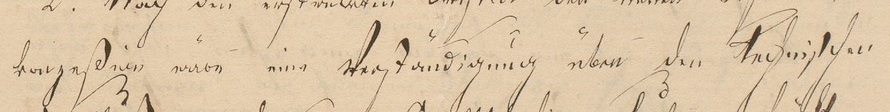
konzeßion wäre eine Verständigung über den technischen
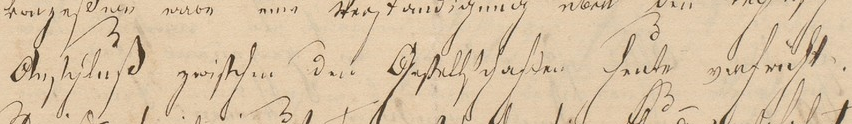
Anschluß zwischen den Gesellschaften heute verfrüht.
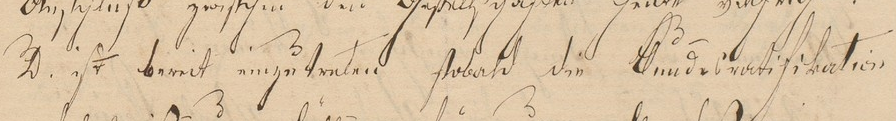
D. ist bereit einzutreten sobald die Bundesratifikation
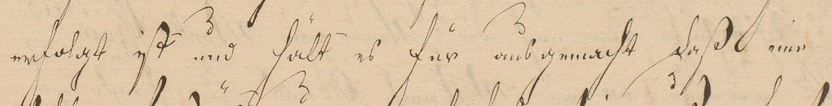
erfolgt ist und hält es für ausgemacht daß eine
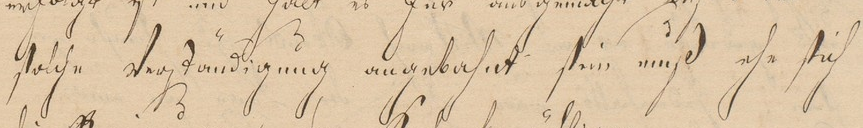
solche Verständigung angebahnt sein muß ehe sich
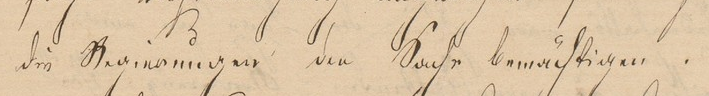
die Regierungen der Sache bemächtigen.
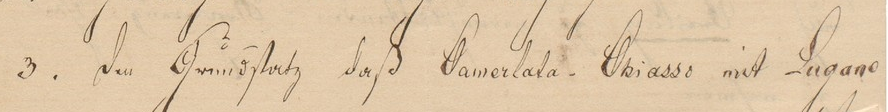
3. Der Grundsatzt daß Camerlata–Chiasso mit Lugano
